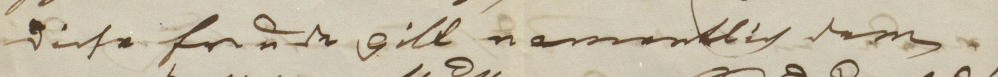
Diese Freude gilt namentlich dem
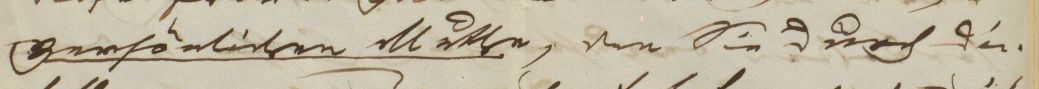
persönlichen Muthe, den Sie durch die-
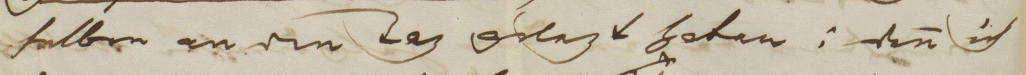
selben an den Tag gelegt haben: Denn ich
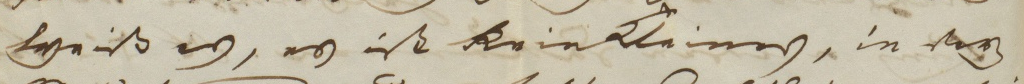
weiß es, es ist kein Kleines, in der
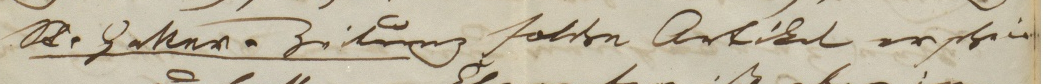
St. Galler–Zeitung solche Artikel erschei-
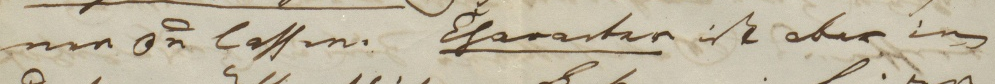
nen zu lassen. Character ist aber in
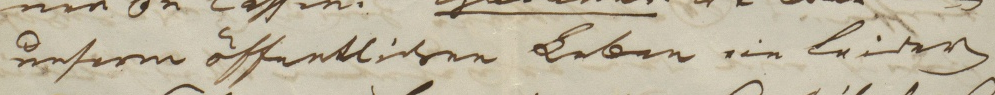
unserm öffentlichen Leben ein leider
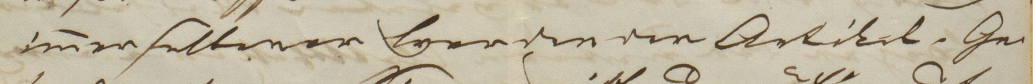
immer seltener werdender Artikel. Ge-
